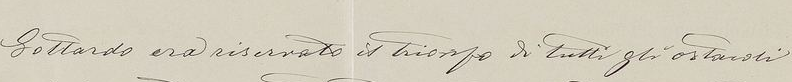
Gottardo era riservato il trionfo di tutti gli ostacoli
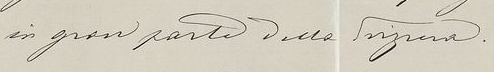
in gran parte della Svizzera.
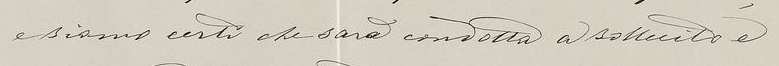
e siamo certi che sarà condotta a sollecito e
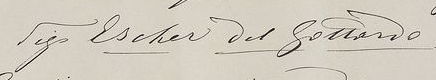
Signor Escher delGottardo.
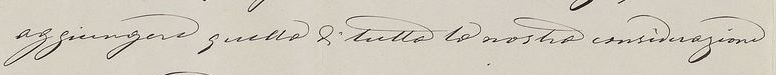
aggiungere quella di tutta nostra considerazione.
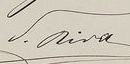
S. Riva
